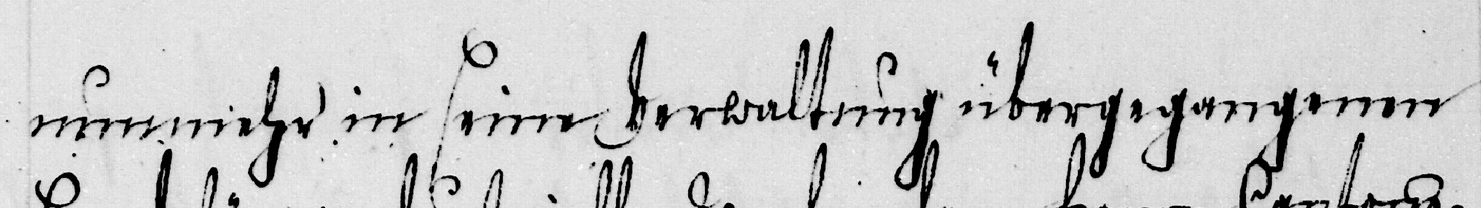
nunmehr in seine Verwaltung übergegangenen
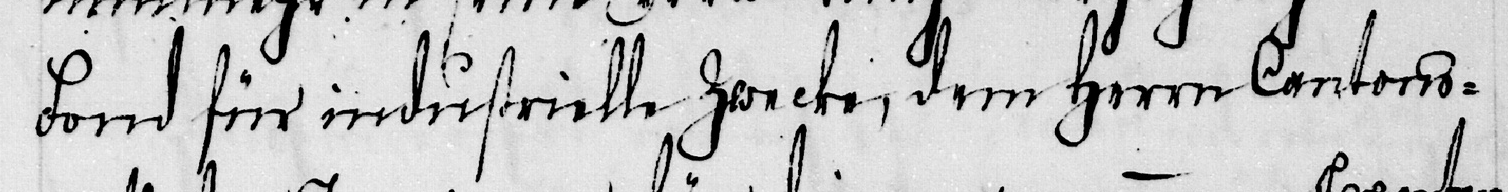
Fond für industrielle Zwecke, dem Herrn Cantons¬
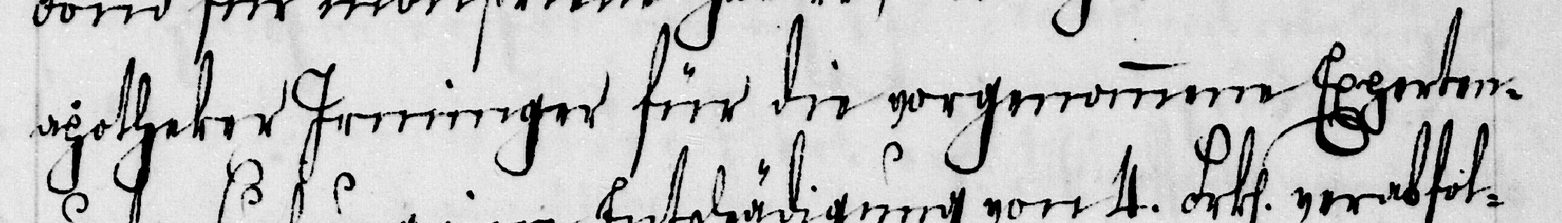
apotheker Irminger für die vorgenommene Experten¬
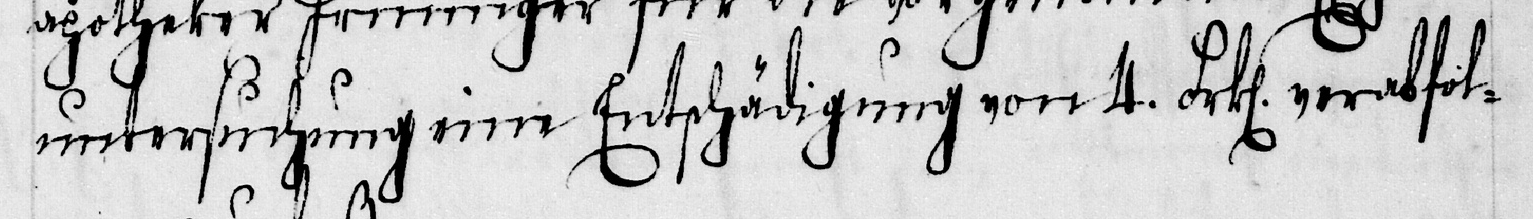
untersuchung eine Entschädigung von 4. Frk[en]. verabfol¬
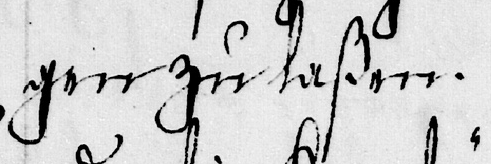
gen zu laßen.
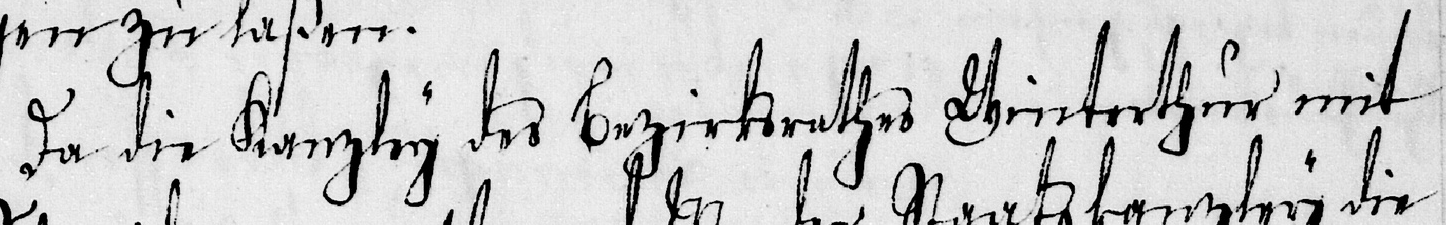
Da die Kanzley des Bezirksrathes Winterthur mit
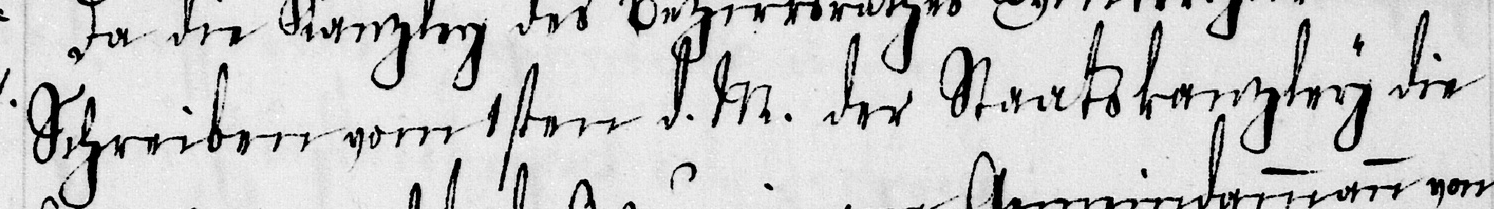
Schreiben vom 1sten d. M. der Staatskanzley die
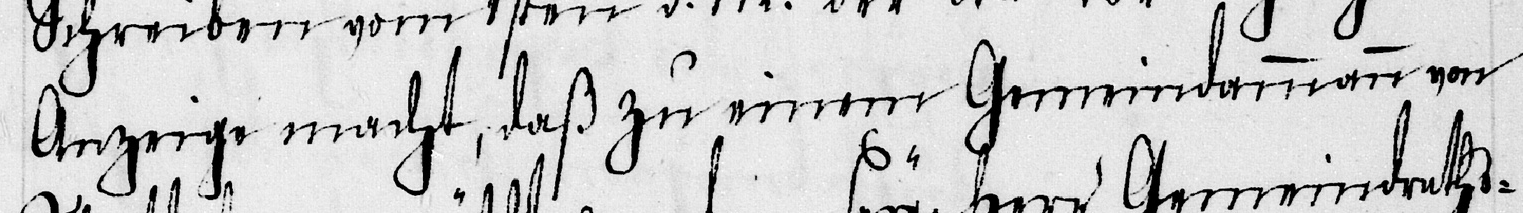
Anzeige macht, daß zu einem Gemeindammann von
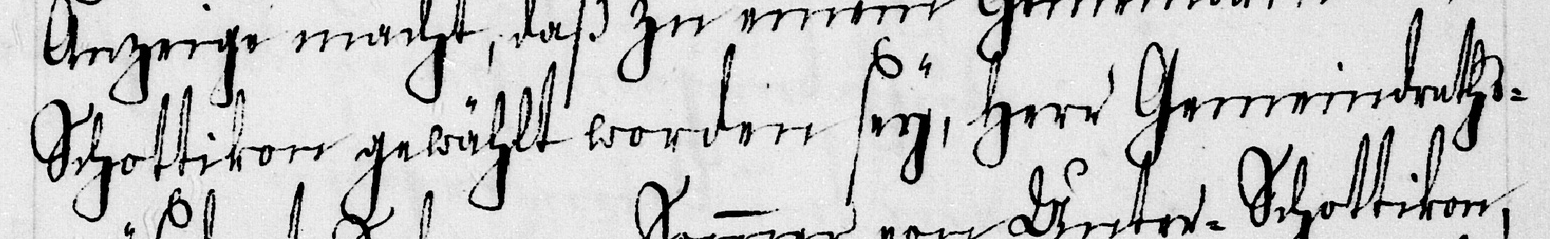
Schottikon gewählt worden sey, Herr Gemeindraths¬
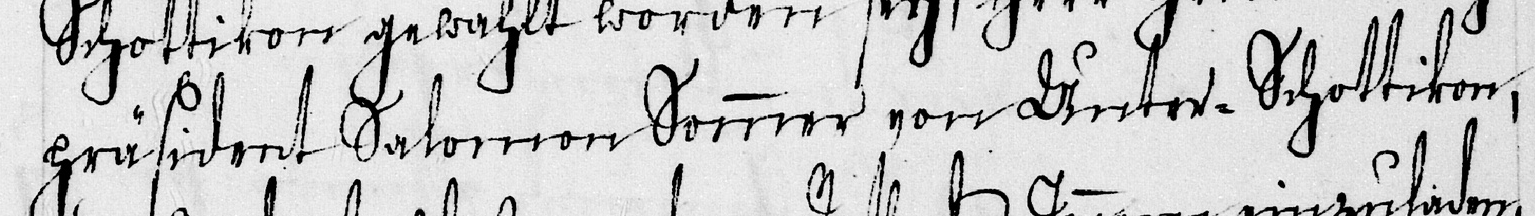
präsident Salomon Sommer von Unter-Schottikon,
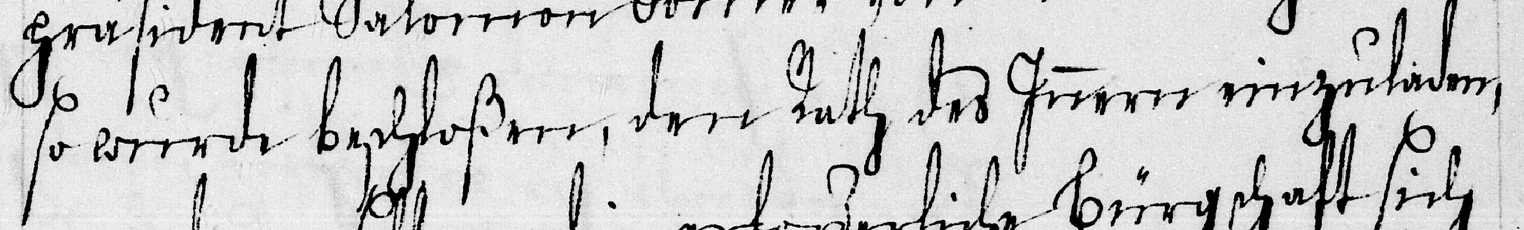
so wurde beschloßen, den Rath des Innern einzuladen,
